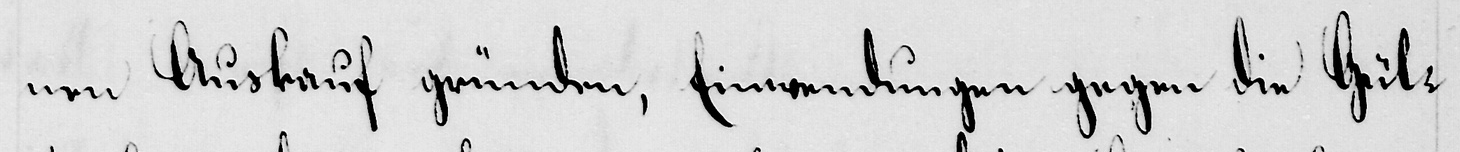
nen Auskauf gründen, Einwendungen gegen die Gül¬
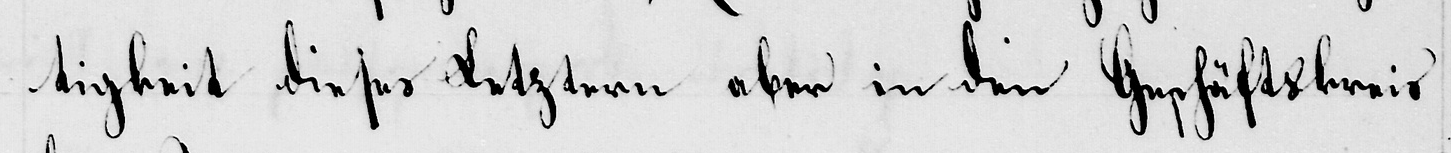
tigkeit dieses Letztern aber in den Geschäftskreis
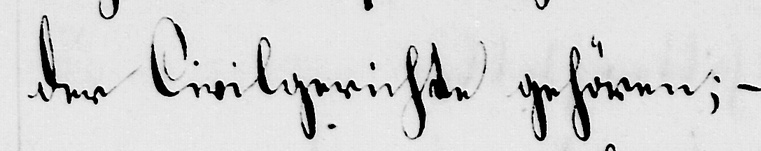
der Civilgerichte gehören;
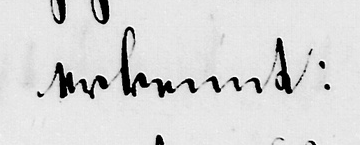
erkennt:
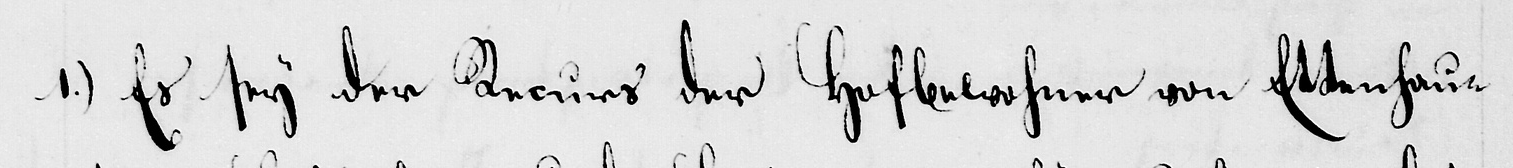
1.) Es sey der Recurs der Hofbewohner von Ettenhau¬
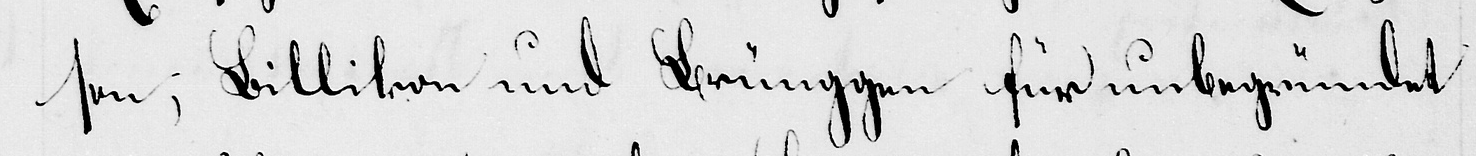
sen, Billikon und Brünggen für unbegründet
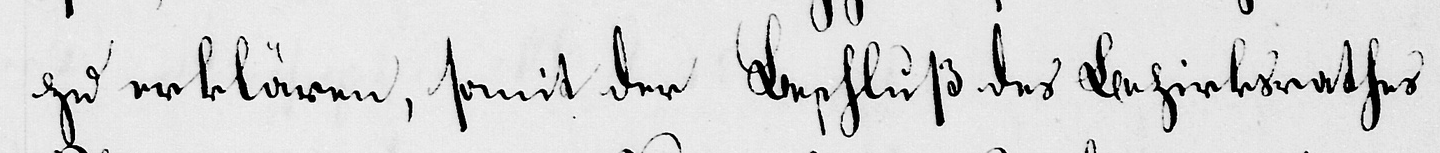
zu erklären, somit der Beschluß des Bezirksrathes
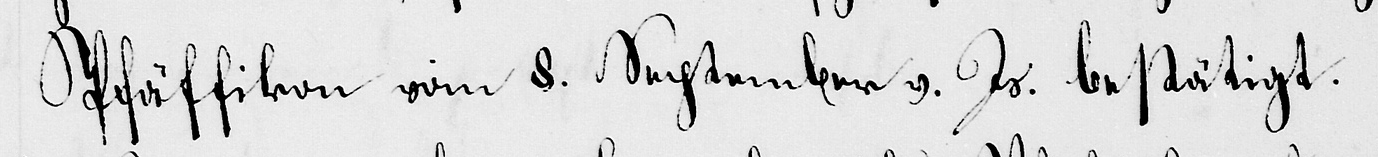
Pfäffikon vom 8. September v. Js. bestätigt.
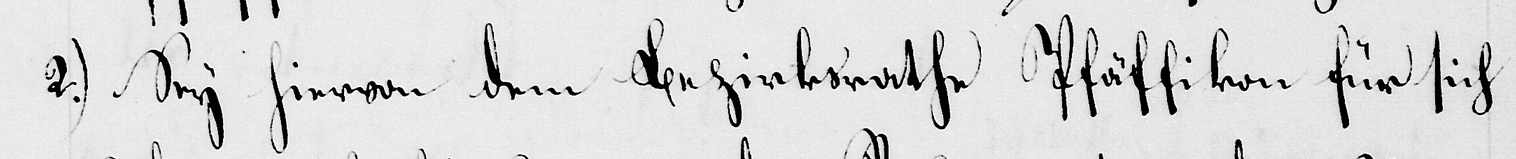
2.) Sey hiervon dem Bezirksrathe Pfäffikon für sich
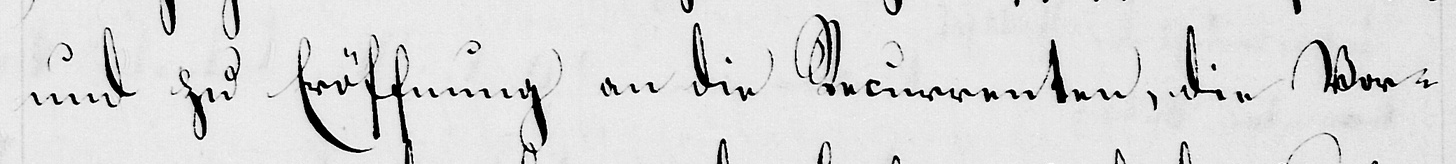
und zu Eröffnung an die Recurrenten, die Vor¬
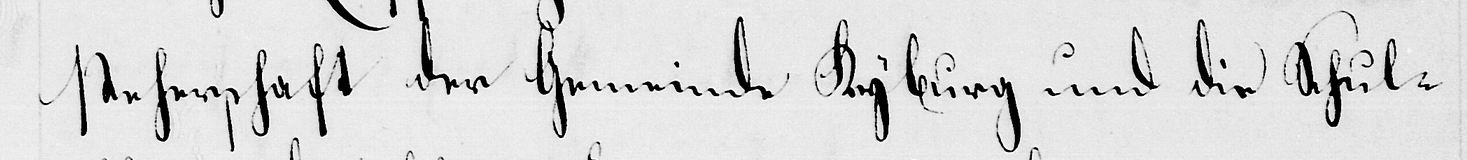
steherschaft der Gemeinde Kyburg und die Schul¬
